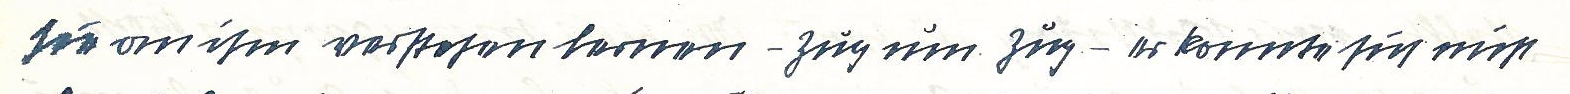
sie an ihm verstehen lernen – Zug um Zug – er konnte sich nicht
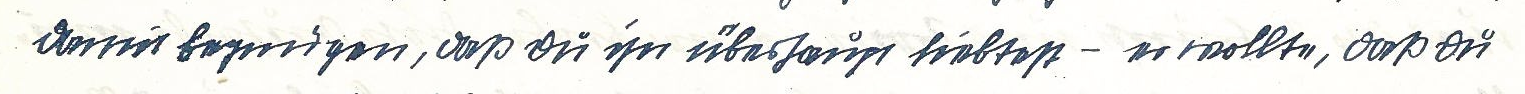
damit begnügen, daß Du ihn überhaupt liebtest – er wollte, daß Du
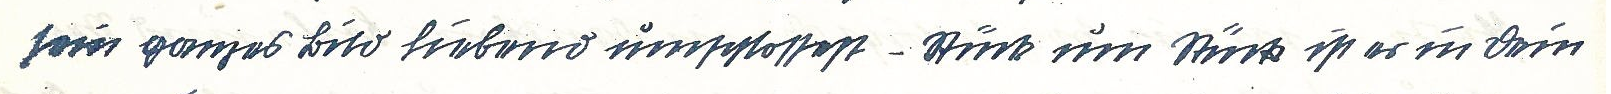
sein ganzes Bild liebend umschlossest – Stück um Stück ist er in Dein
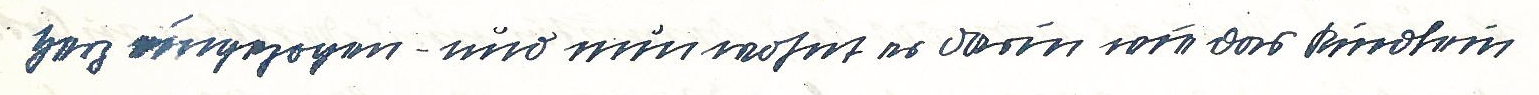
Herz eingezogen – und nun wohnt er darin wie das Kindlein
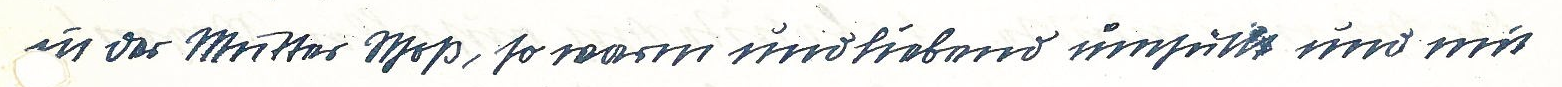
in der Mutter Schoß, so warm und liebend umhüllt und mit
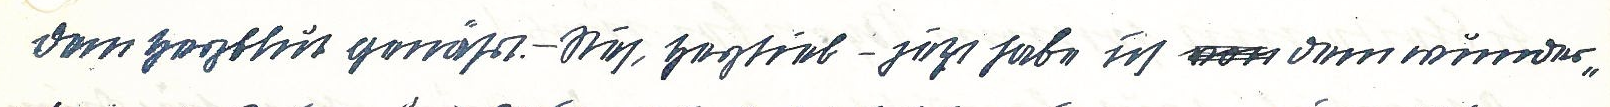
dem Herzblut genährt. – Sieh, Herzlieb – jetzt habe ich von dem wunder¬
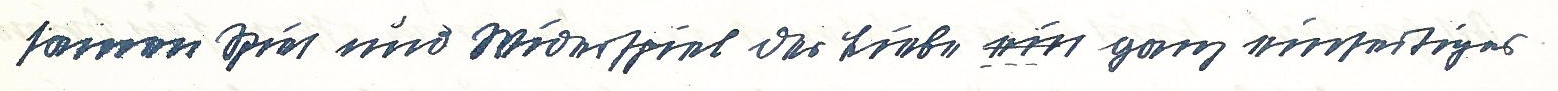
baren Spiel und Widerspiel der Liebe ein ganz einseitiges
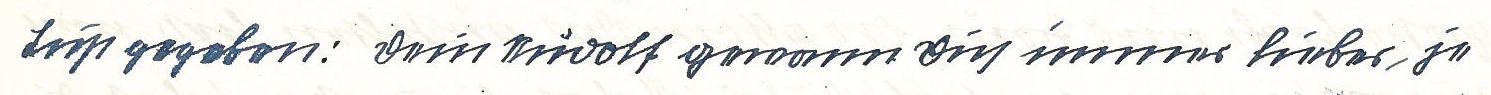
Licht gegeben: Dein Rudolf gewann Dich immer lieber, je
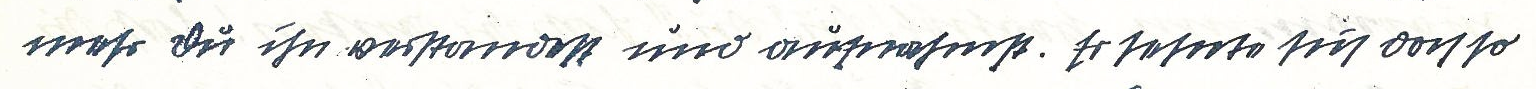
mehr Du ihn verstandest und aufnahmst. Er sehnte sich doch so
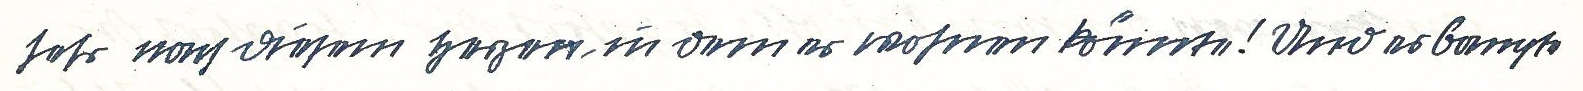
sehr nach diesem Herzen, in dem er wohnen könnte! Und er bangte
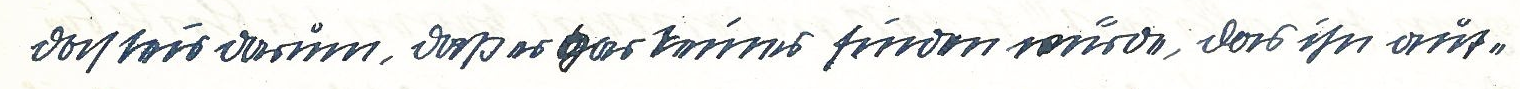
doch leis darum, daß er gar keines finden würde, das ihn auf¬
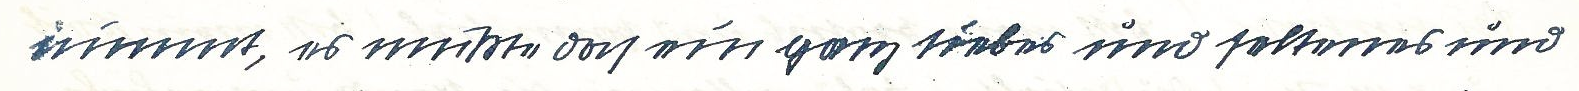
nimmt, es mußte doch ein ganz liebes und seltenes und
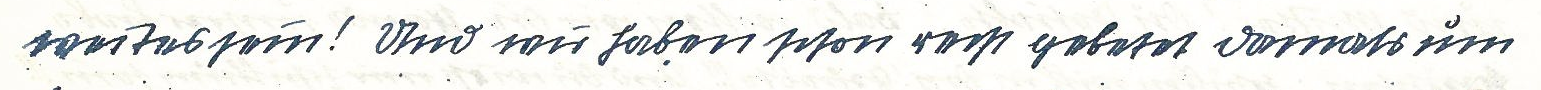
weites sein! Und wir haben schon recht gebetet damals um
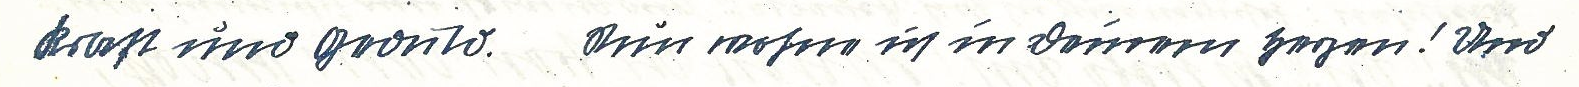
Kraft und Geduld. Nun wohne ich in Deinem Herzen! Und
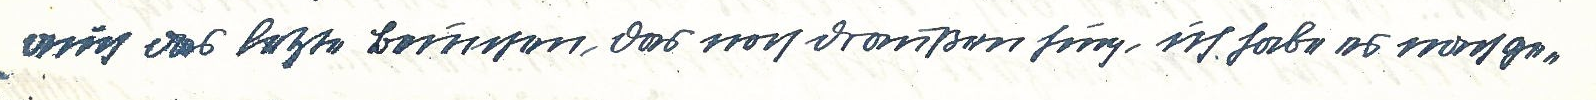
auch das letzte Beinchen, das noch draußen hing, ich habe es nachge¬
